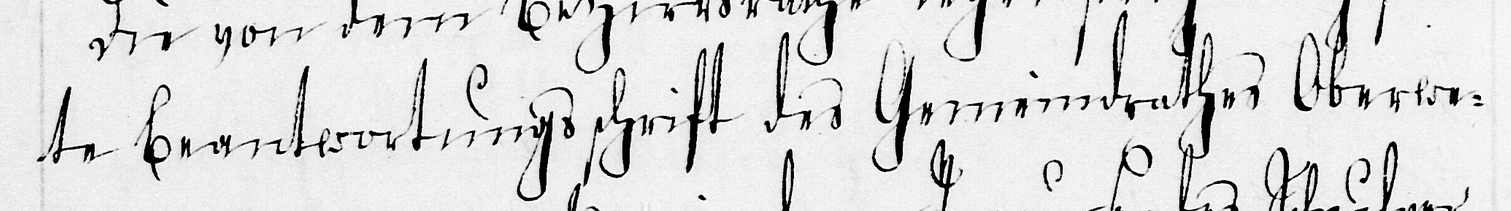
te Beantwortungsschrift des Gemeindrathes Oberwe¬
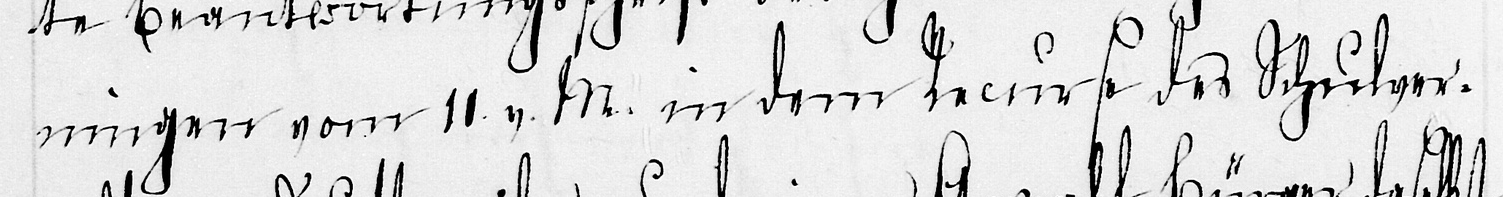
ningen vom 11. v. M. in dem Recurse des Schulver¬
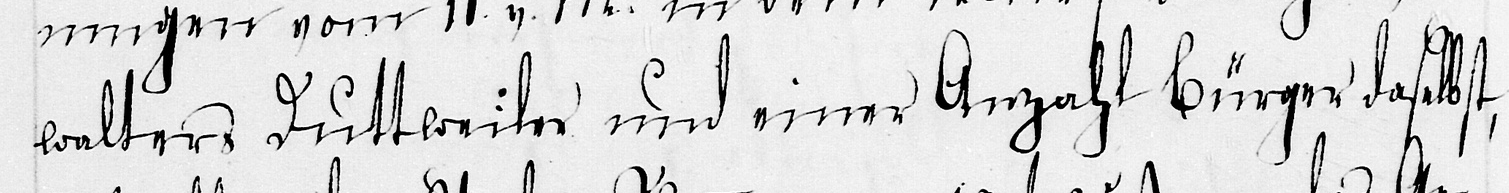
walters Duttweiler und einer Anzahl Bürger daselb¬
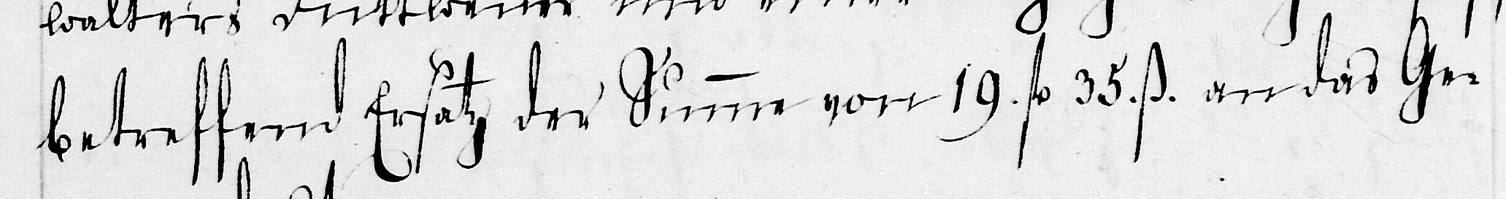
betreffend Ersatz der Summe von 19. fl. 35. ß. an das Ge¬
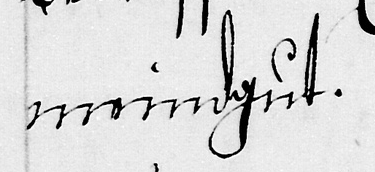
meindgut.
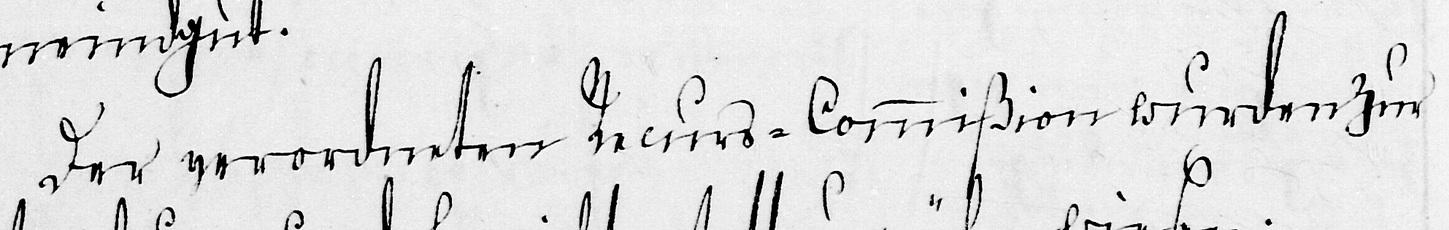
Der verordneten Recurs-Commißion wurden zur
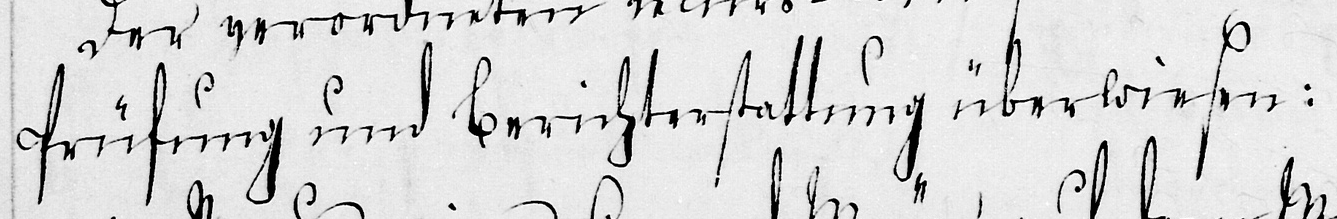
Prüfung und Berichterstattung überwiesen:
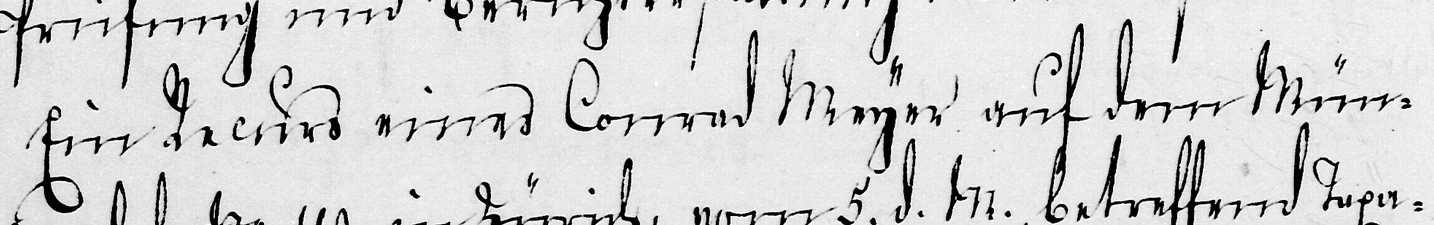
Ein Recurs eines Conrad Meyer auf dem Mün¬
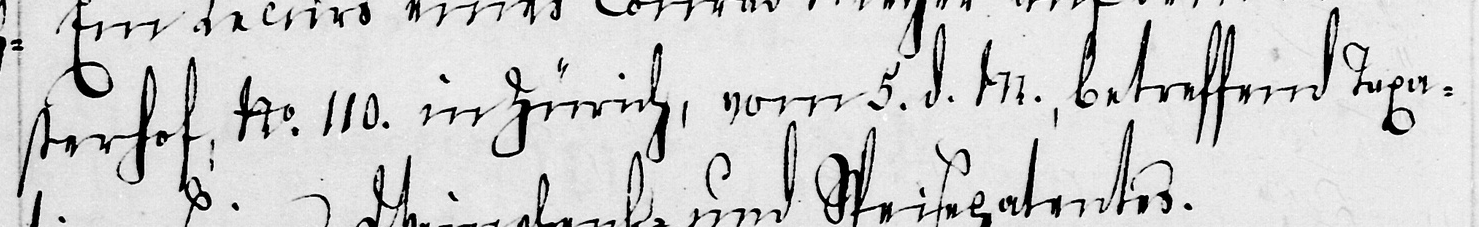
sterhof, No. 110. in Zürich, vom 5. d. M., betreffend Taxa¬
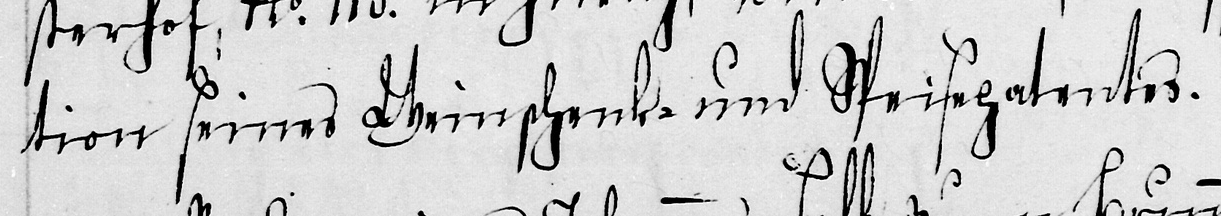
tion seines Weinschenk- und Speisepatentes.
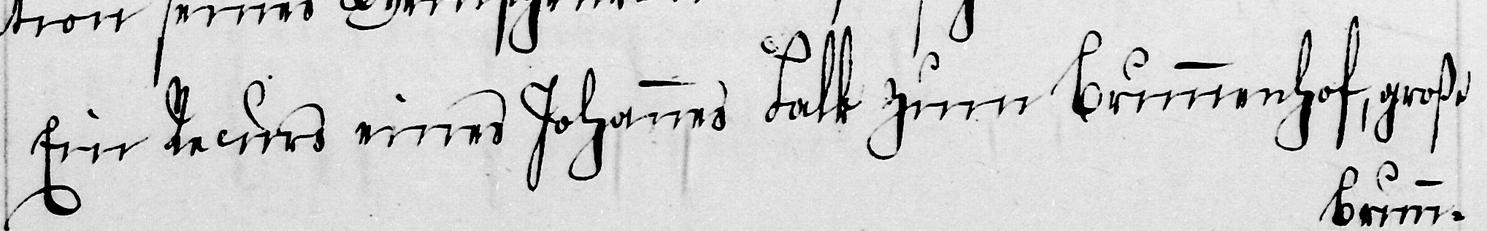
Ein Recurs eines Johannes Falk zum Brunnenhof, große
